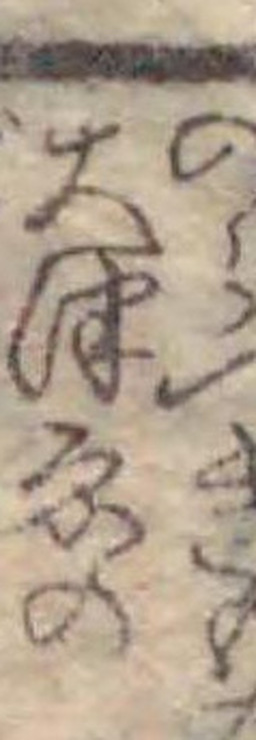大津ゑの
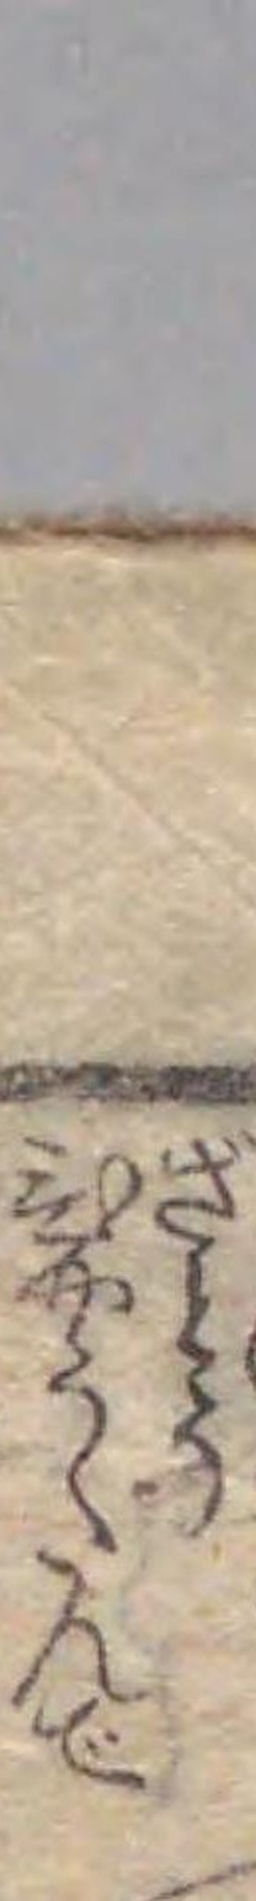ひやうたんで
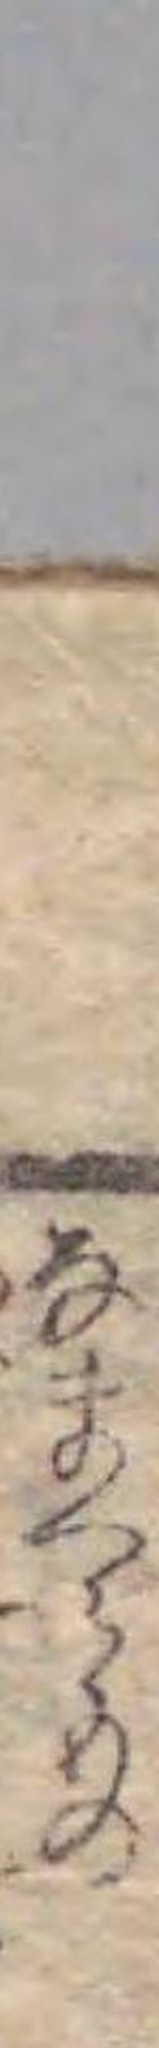なまつらもの
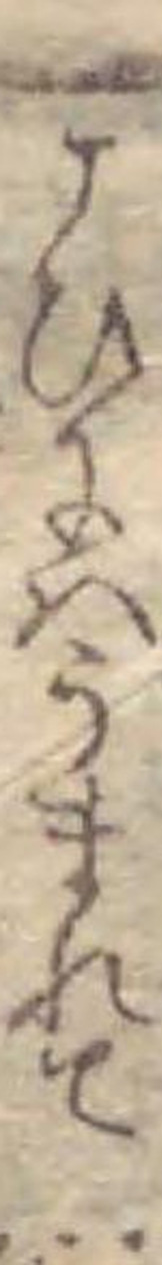てひにはうまれて
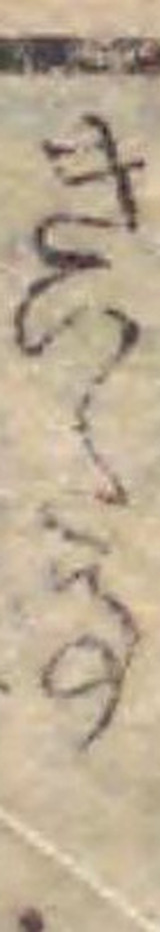きいた事
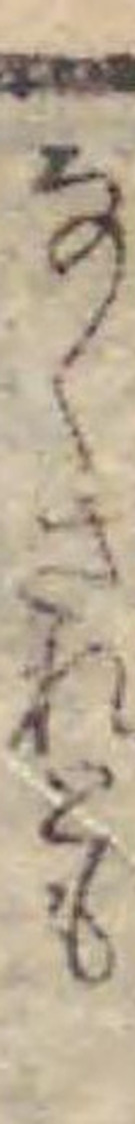なくされとも
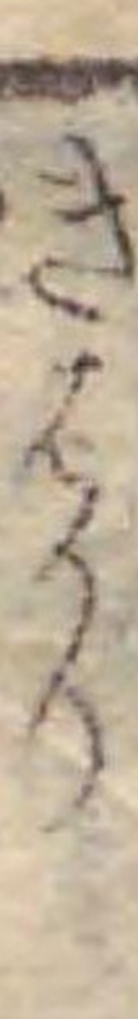きはかり
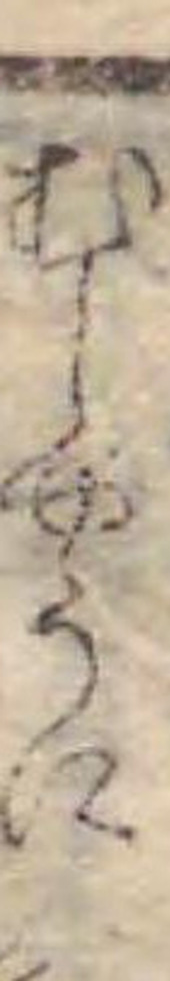むしやうに
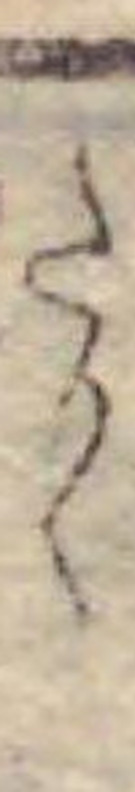たかく
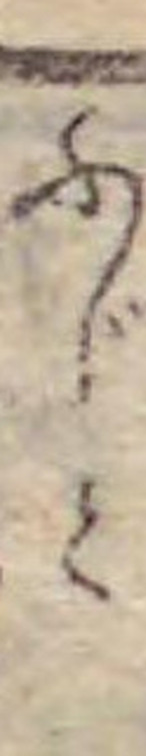ふじと
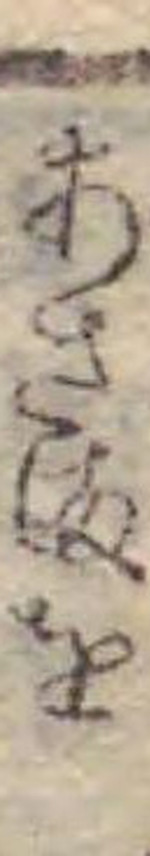あさまを
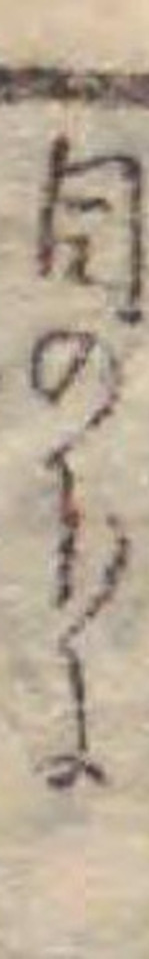目の下に
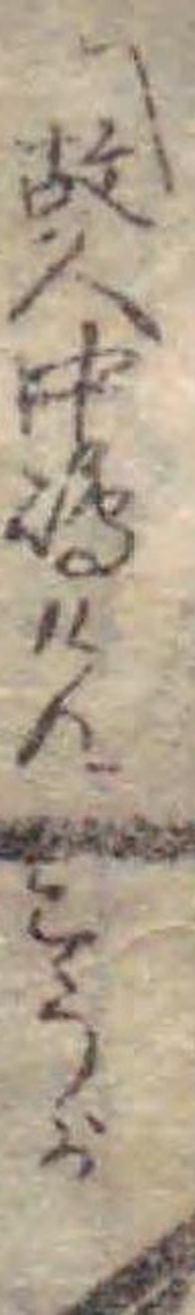〽故人中嶋けんこうが
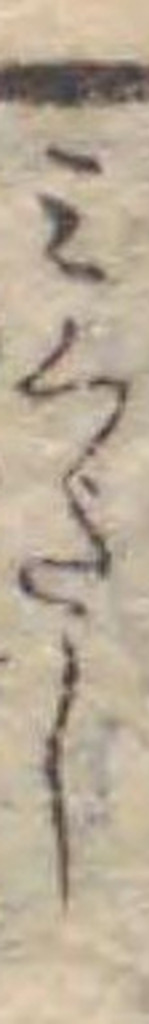みくだし
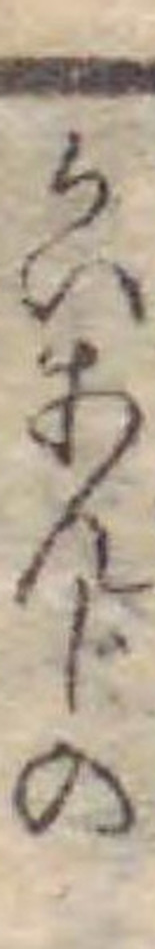かいあんじの
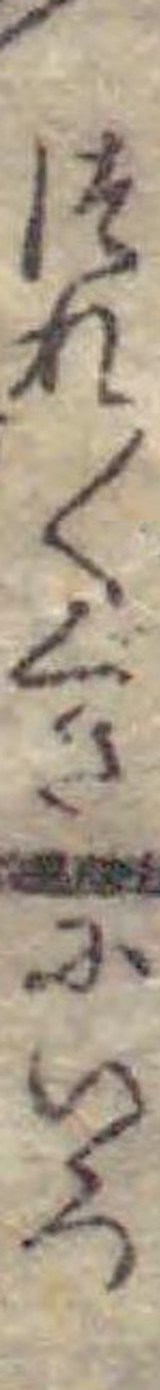つれ〳〵ぐさにいろ
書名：人間一心覗替繰 : 2巻
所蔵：国立国会図書館 National Diet Library, JAPAN
